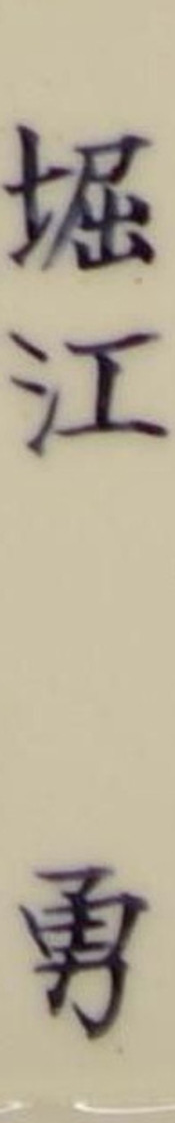堀江勇
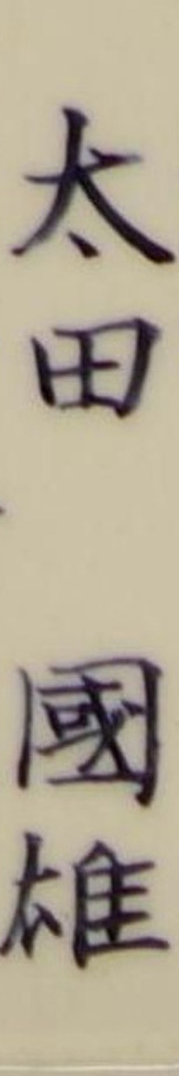太田国雄
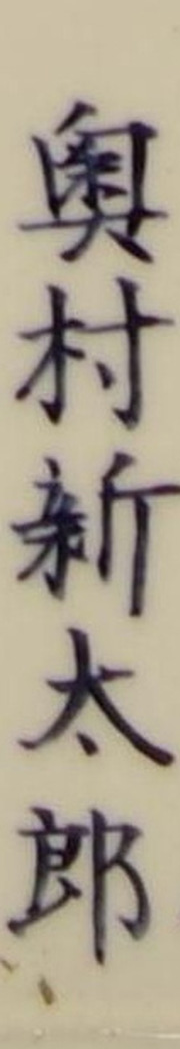奥村新太郎
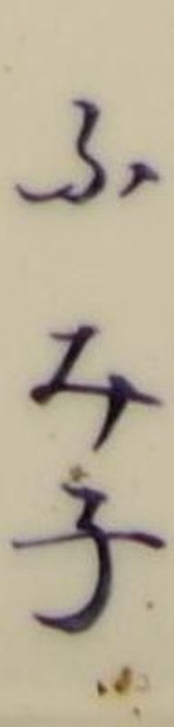ふみ子
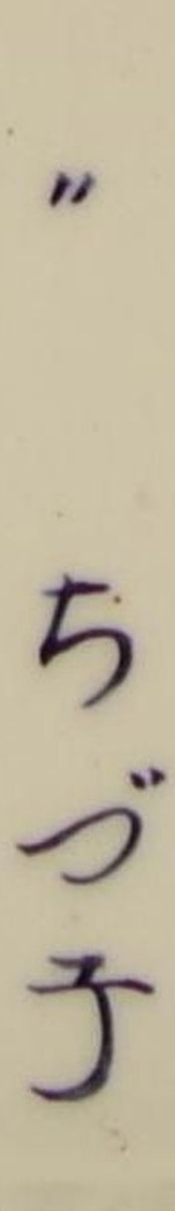ちづ子
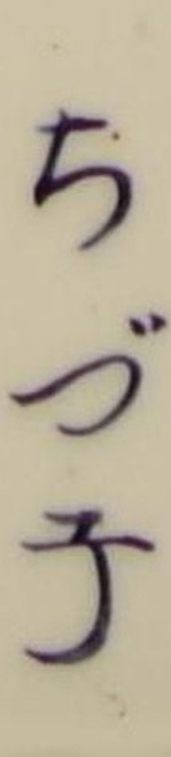ちづ子
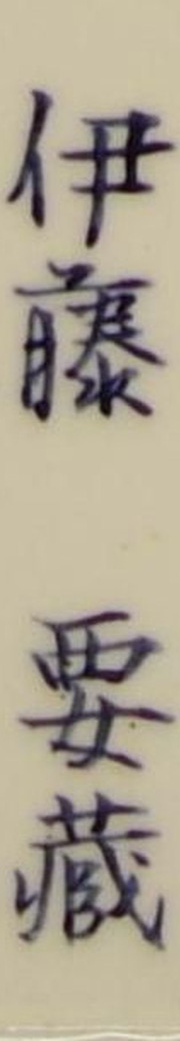伊藤要藏
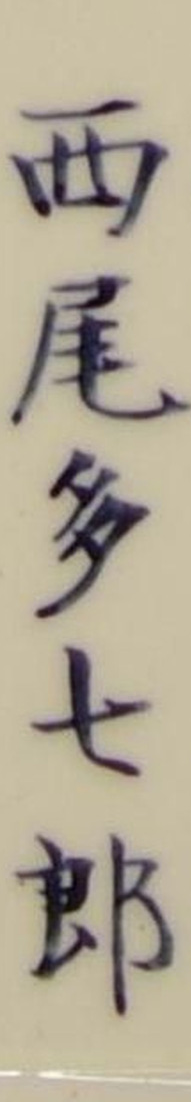西尾多七郎
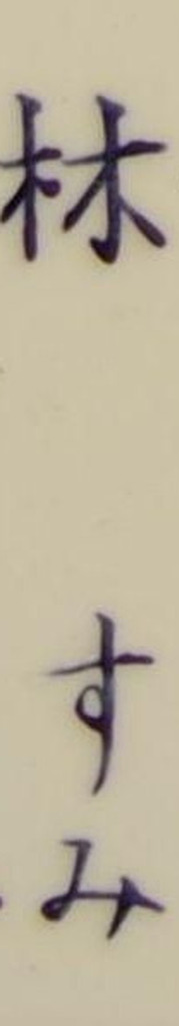林すみ
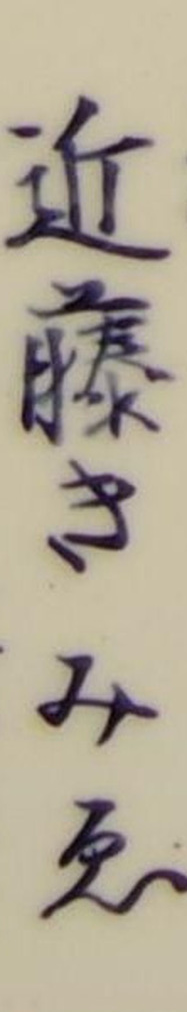近藤きみゑ
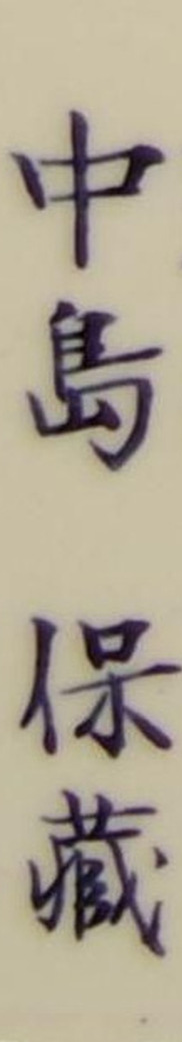中島保蔵
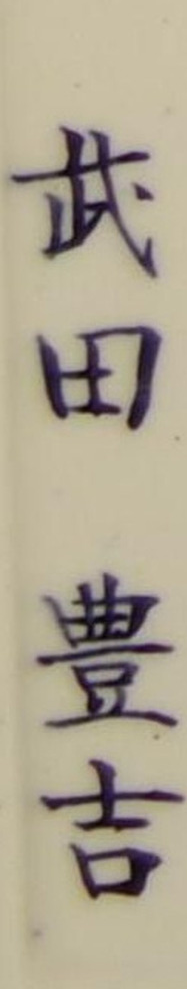武田豊吉

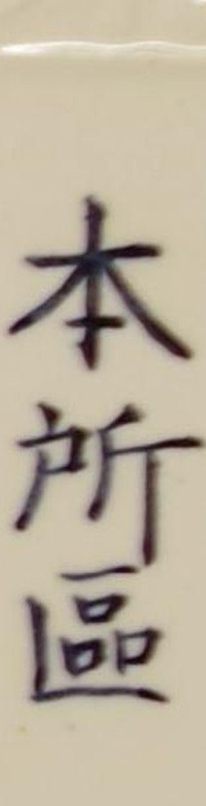＠本所区
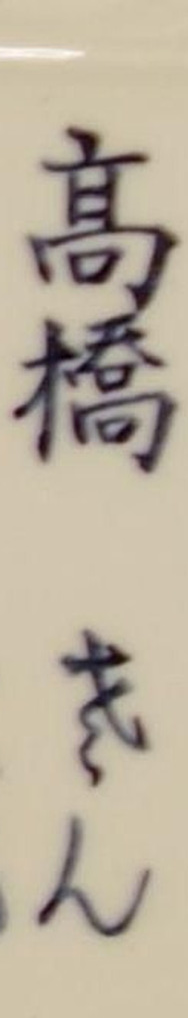高橋さん
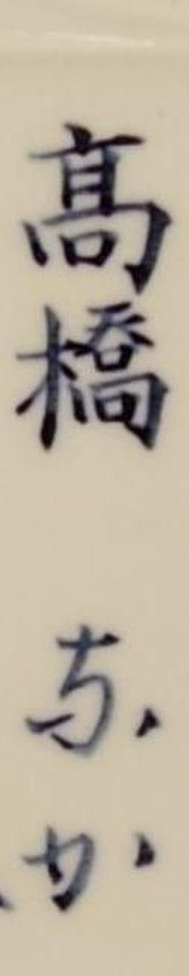高橋なか
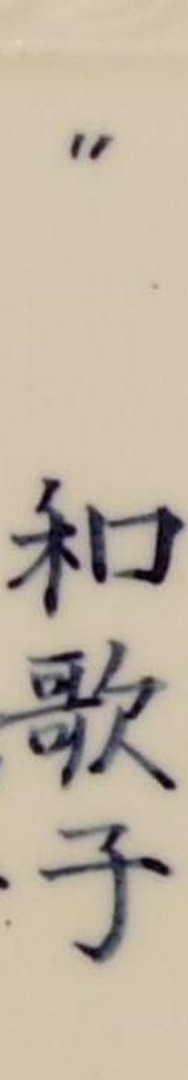和歌子
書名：E~L
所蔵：高野山金剛峯寺
